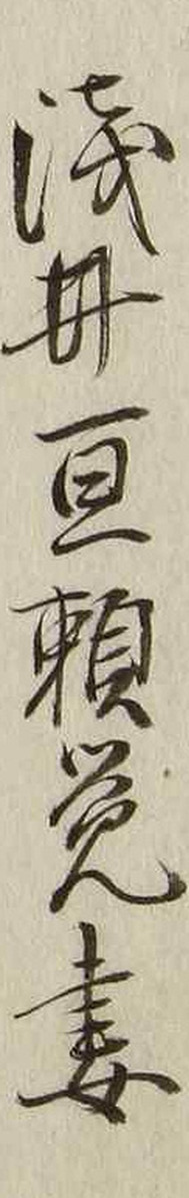女浅井亘頼覚妻
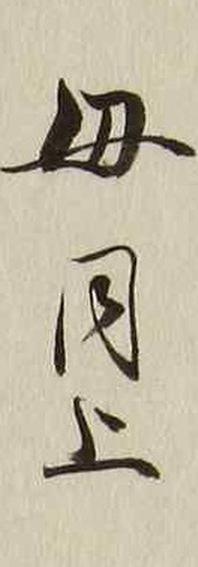母同上
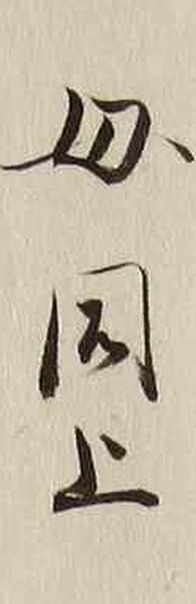母同上
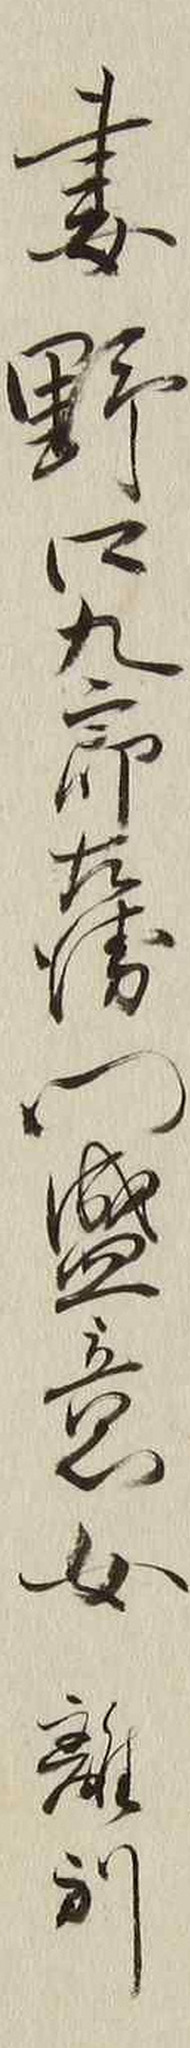妻野口九郎左衛門盛意女離別
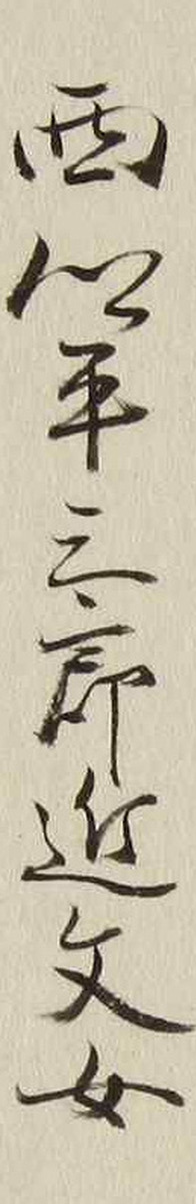西郷平三郎近文女
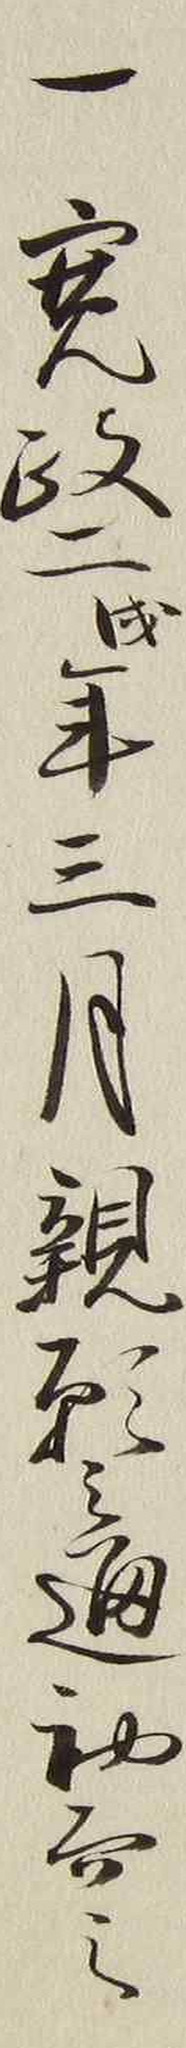一寛政二戌年三月親願之通初而之
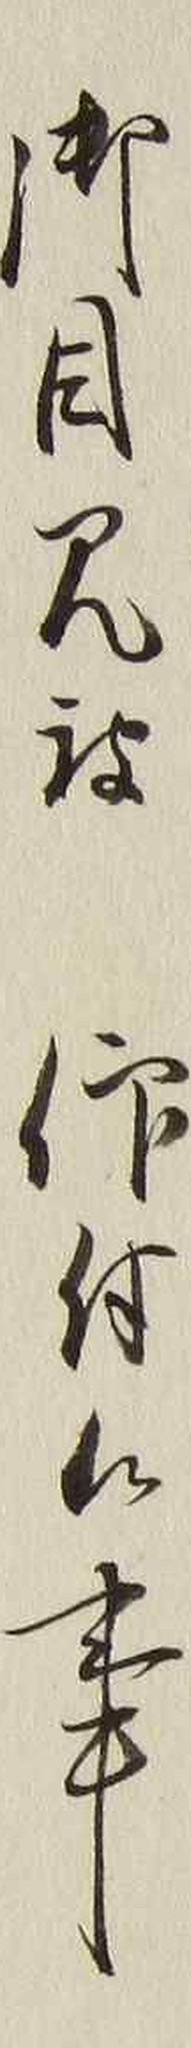御目見被仰付候事
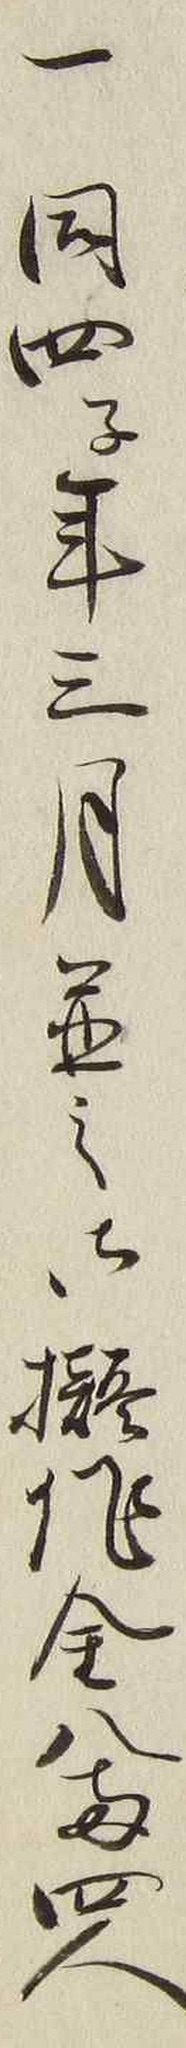一同四子年三月並之御擬作金八両四人
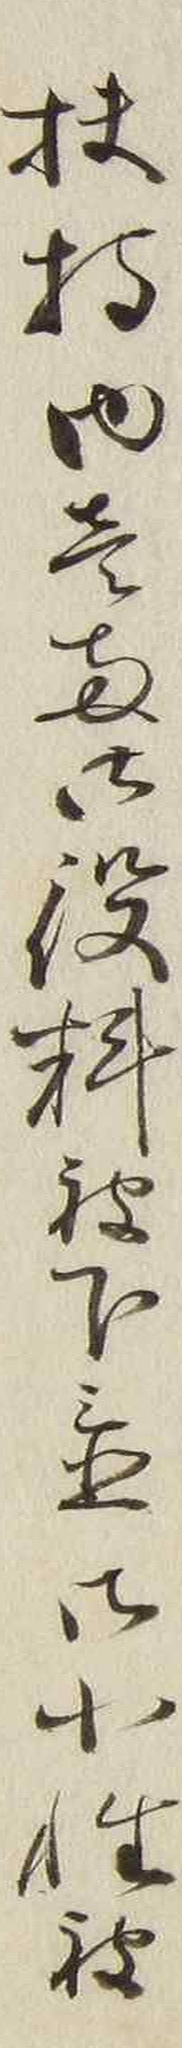扶持内壱両御役料被下置御小性被

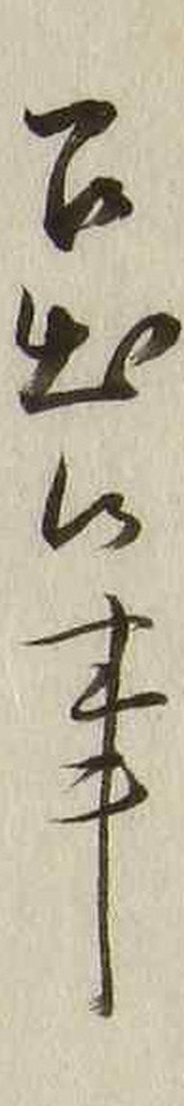召出候事
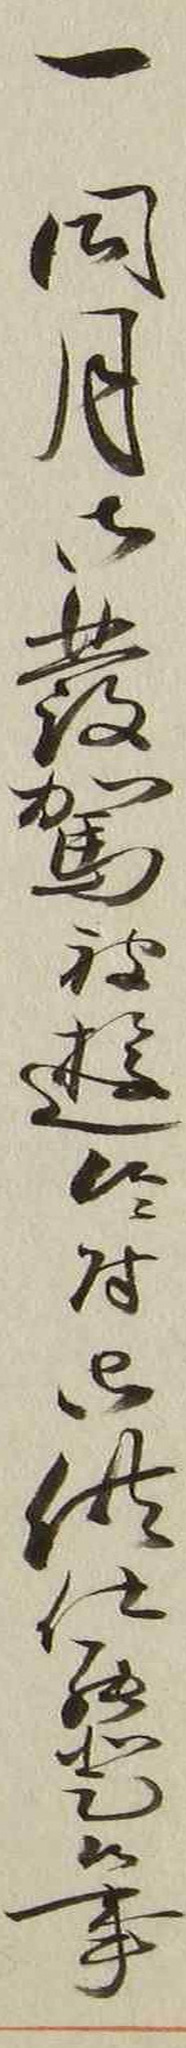一同月御発駕被遊候ニ付御供仕罷登候事
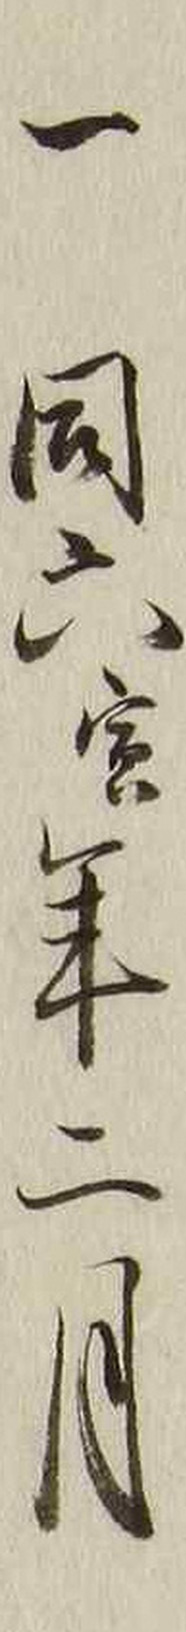一同六寅年二月
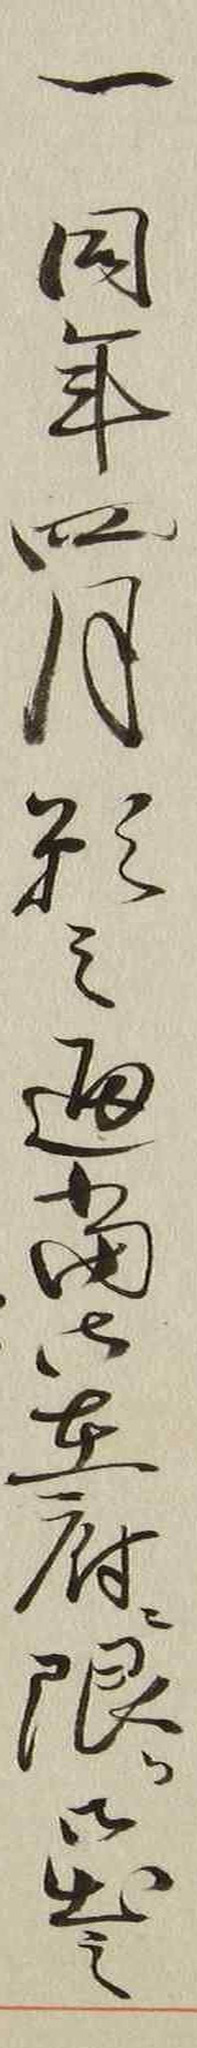一同年四月願之通当御在府ニ限り御出之
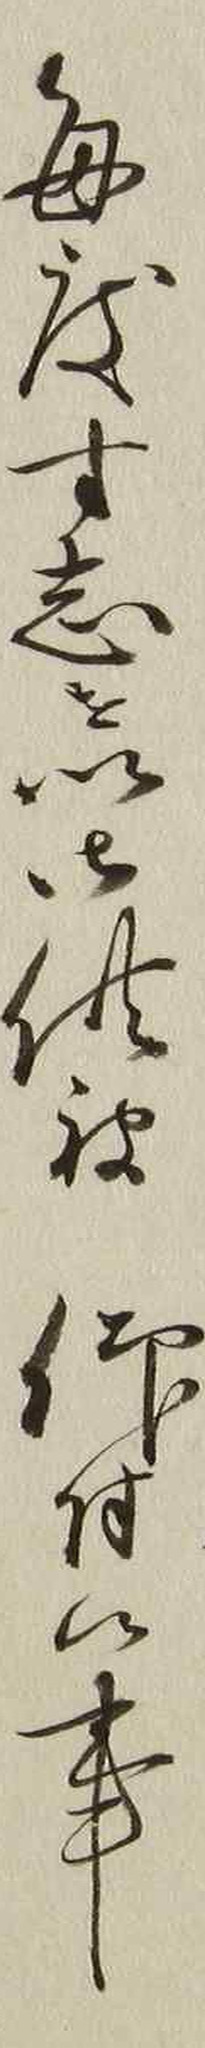毎度寸志を以御供被仰付候事
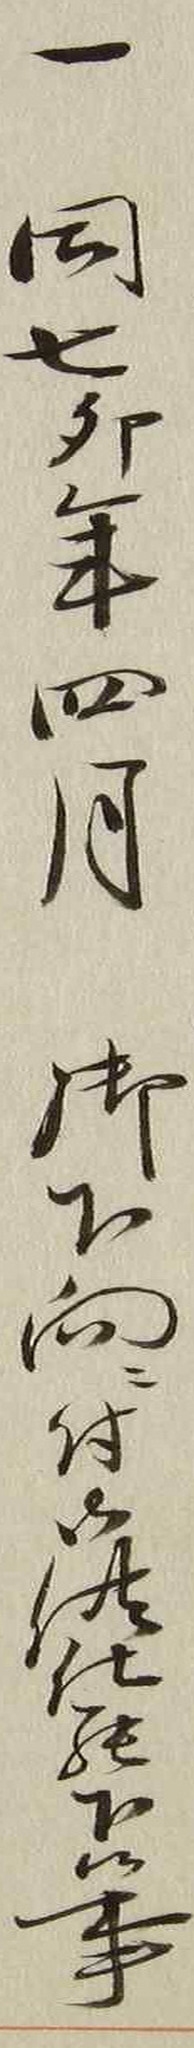一同七卯年四月御下向ニ付御供仕罷下候事
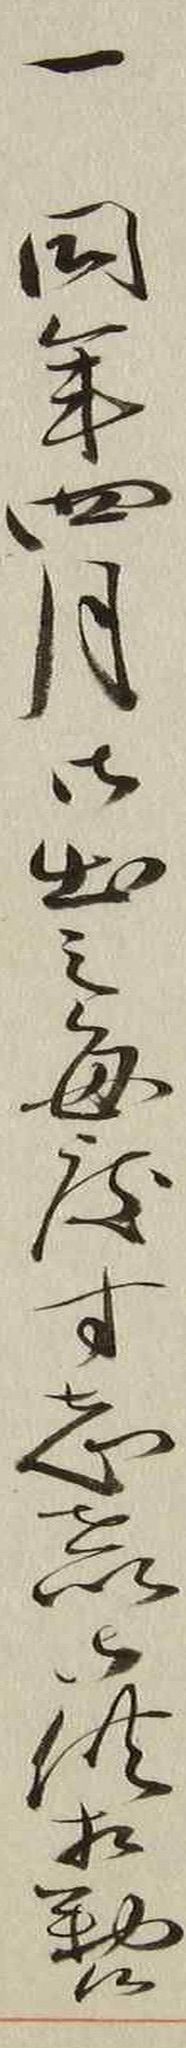一同年四月御出之毎度寸志を以御供相勤候
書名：諸士系譜　巻之163　な之部5
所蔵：会津若松市立会津図書館
